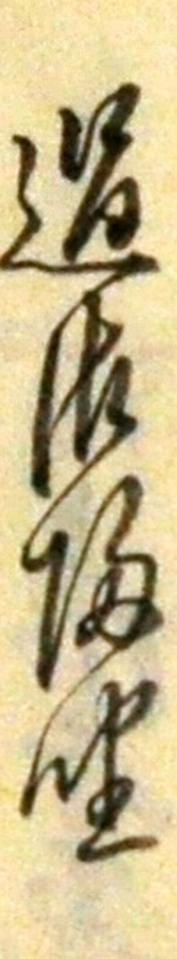過御帰座

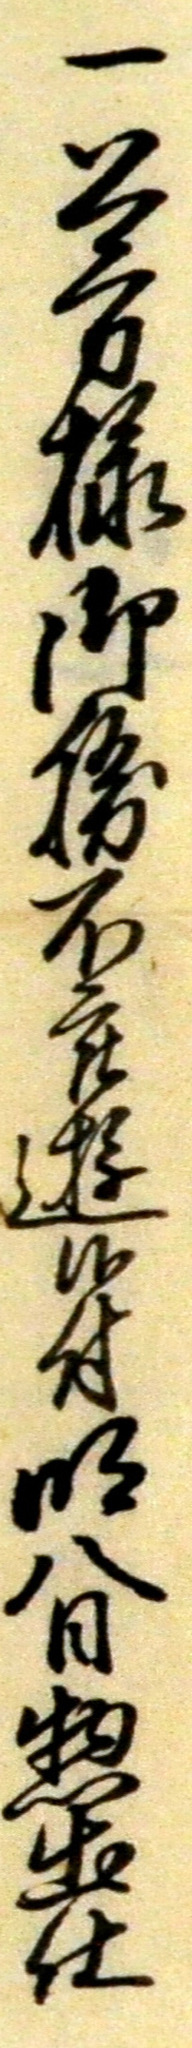一公方様御勝不被遊候付明八日惣出仕
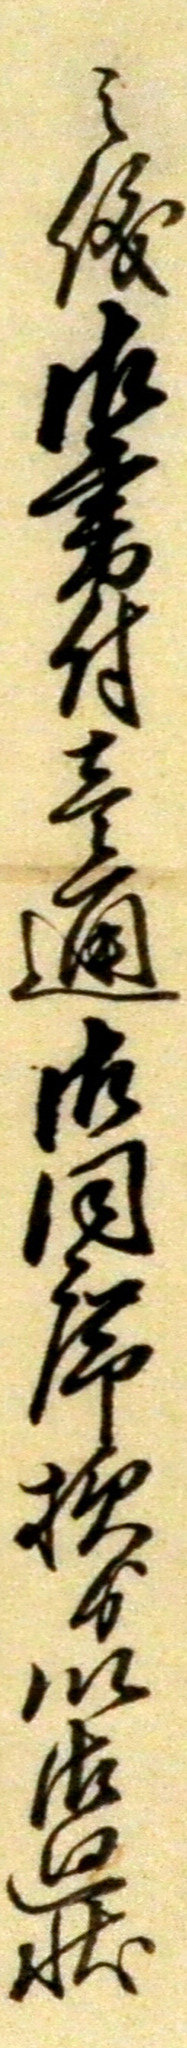之儀御書付壱通御同席様ゟ以御廻状
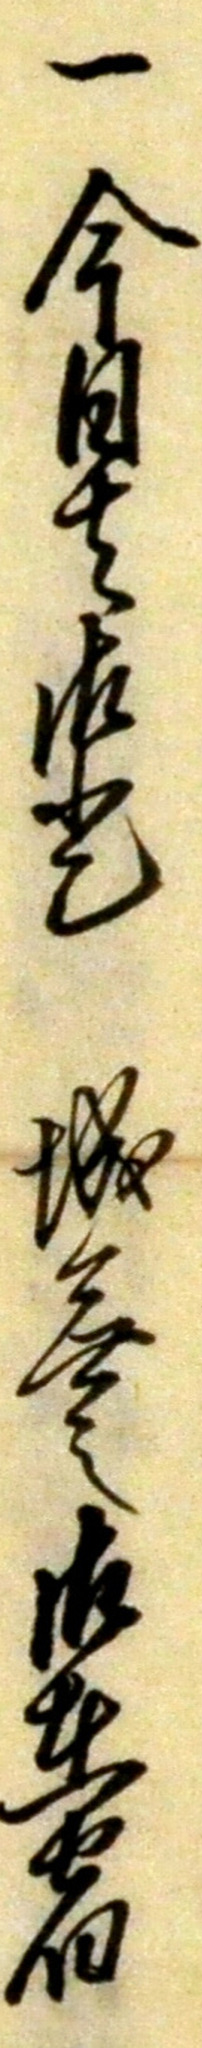一今日者御登城無之御在宿
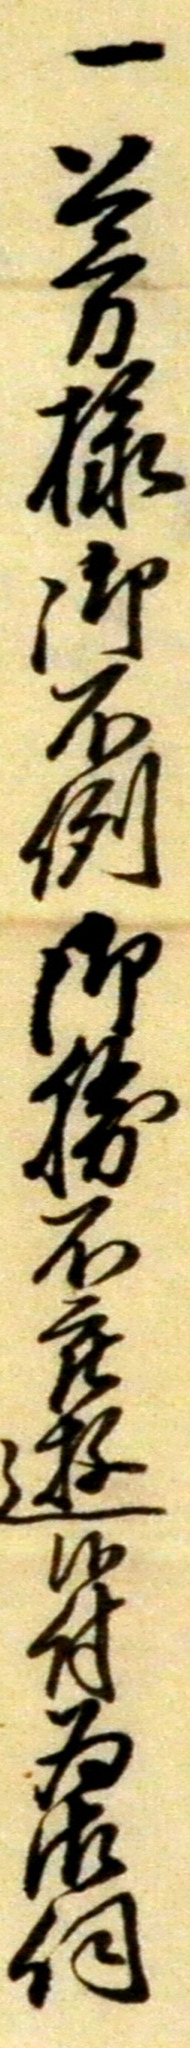一公方様御不例御勝不被遊候付為御伺
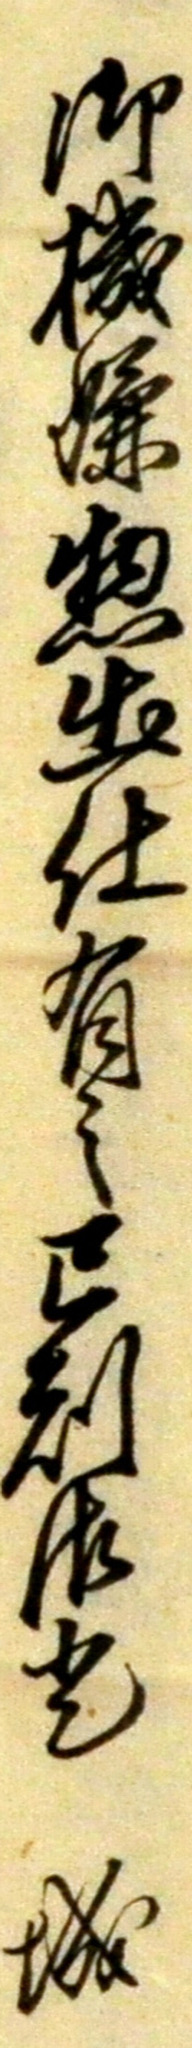御機嫌惣出仕有之巳刻御登城
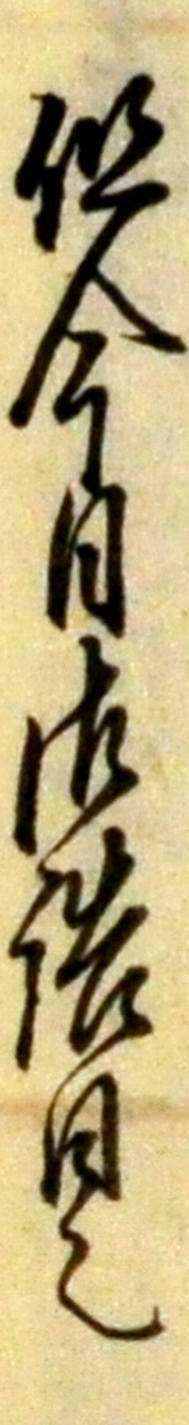但今日御詰日也
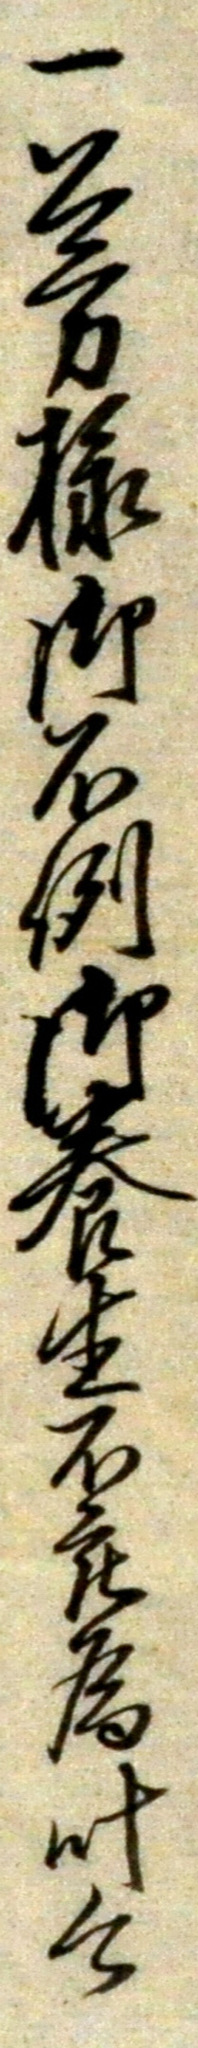一公方様御不例御養生不被為叶今
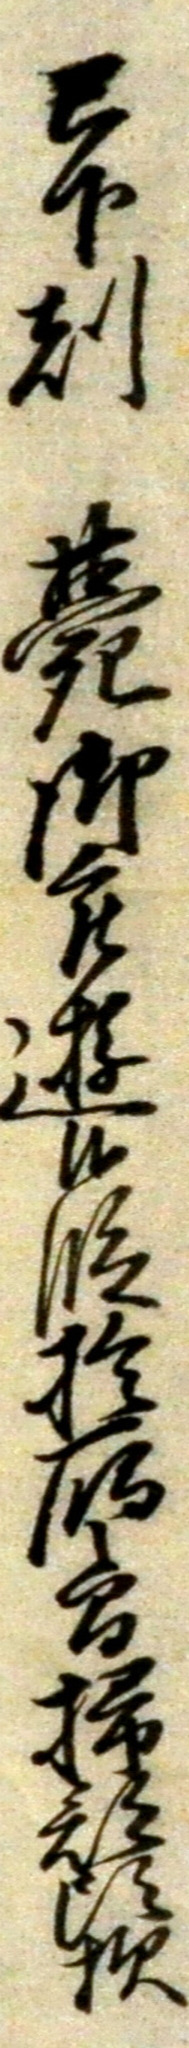已下刻薨御被遊候段於鳫之間掃部頭様
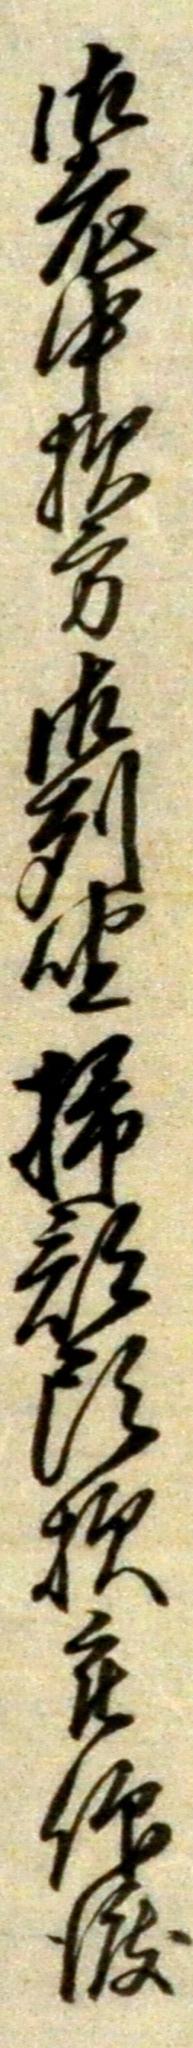御老中様方御列座掃部頭様被仰渡
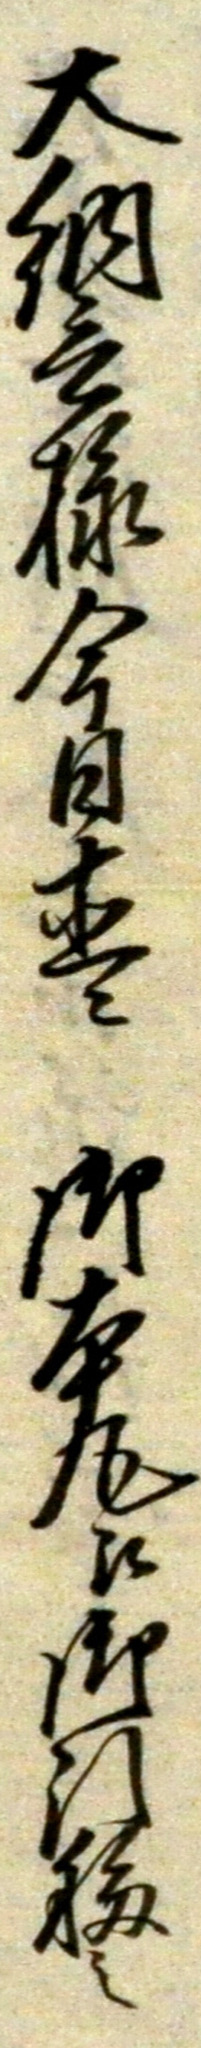大納言様今日直ニ御本丸江御引移之
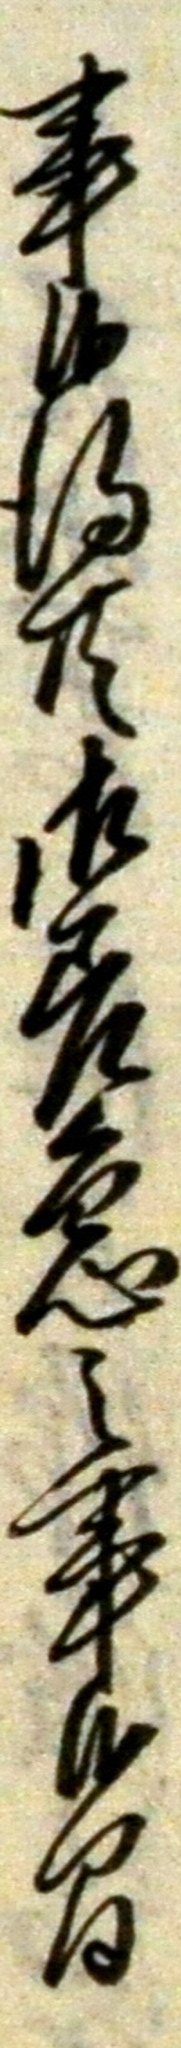事候得共御差急之事候間
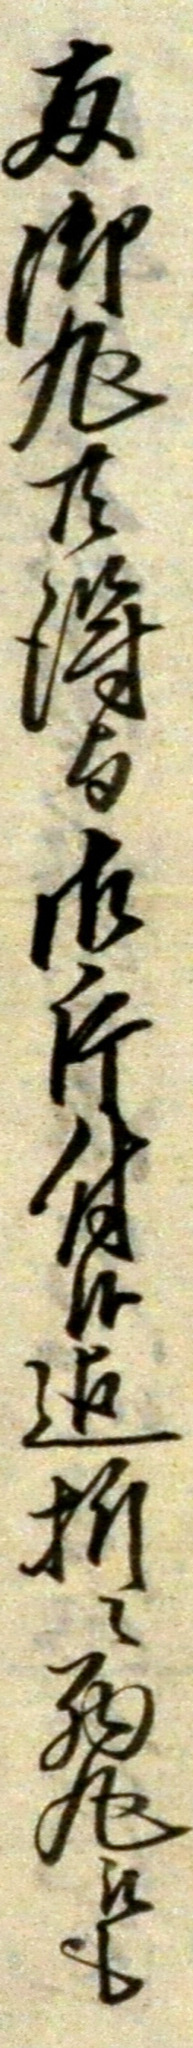両御丸共得与御片付候迄折々西丸江も
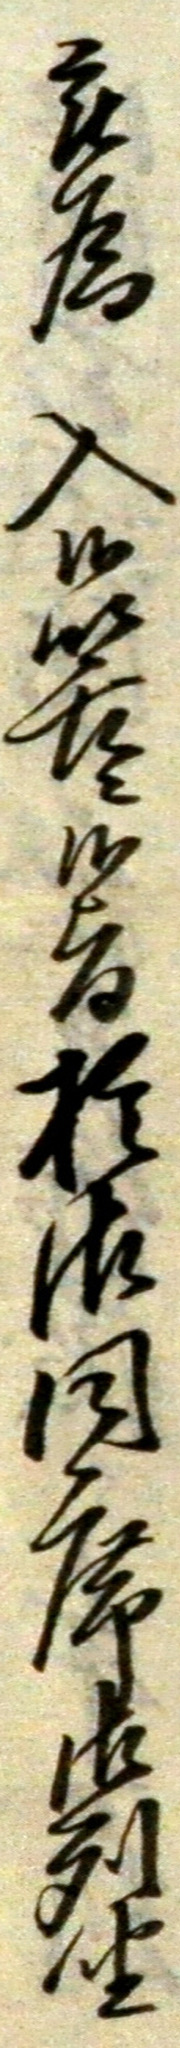被為入候筈ニ候旨於御同席御列座

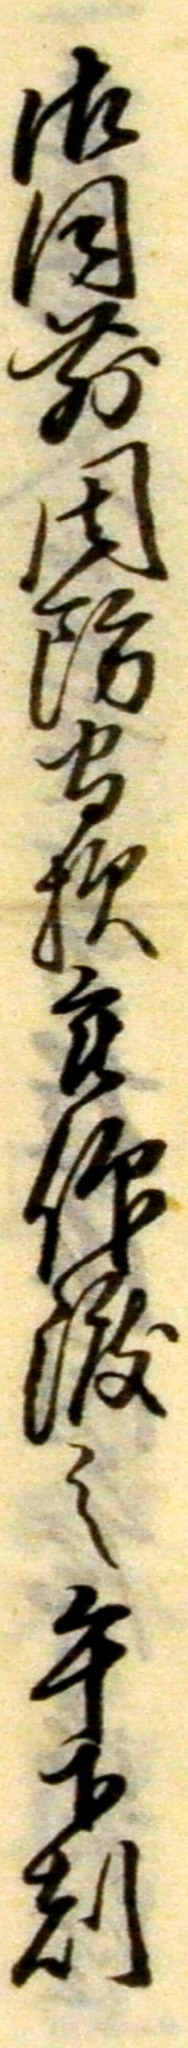御目前周防守様被仰渡之午下刻
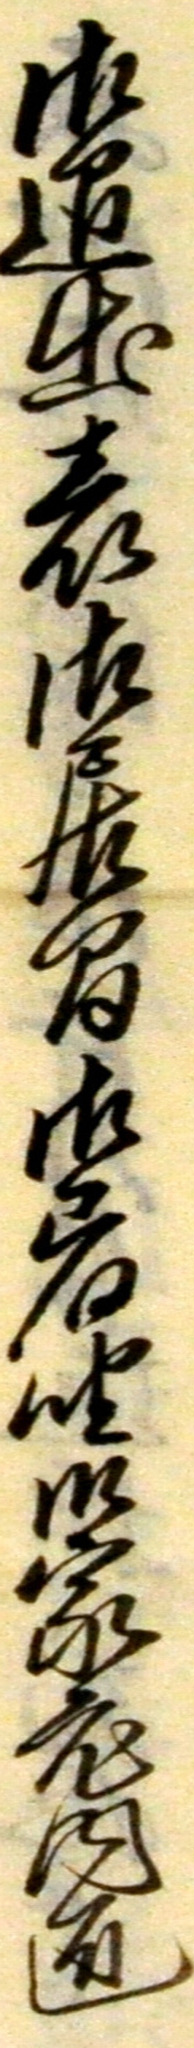御退出表御居間御着座御家老内通
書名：書抜
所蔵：伊那市立高遠町図書館・合同会社AMANE
